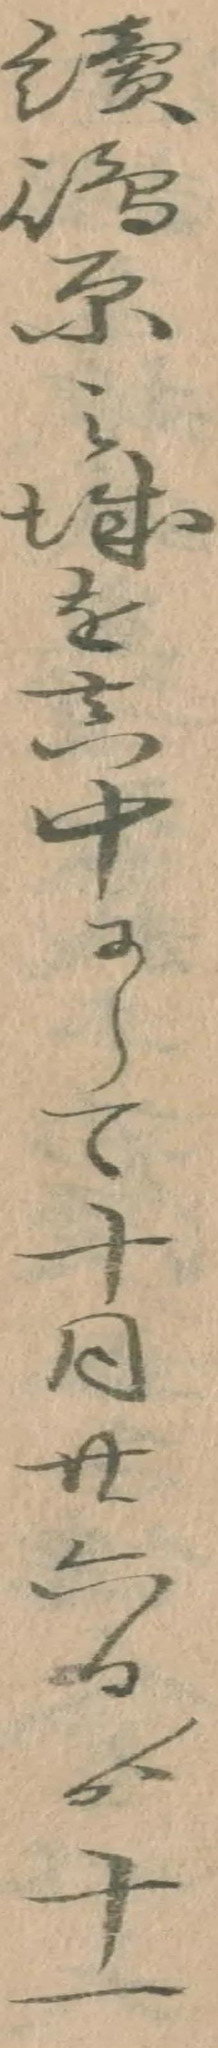続島原之城を真中尓して十月廿六日ゟ十一
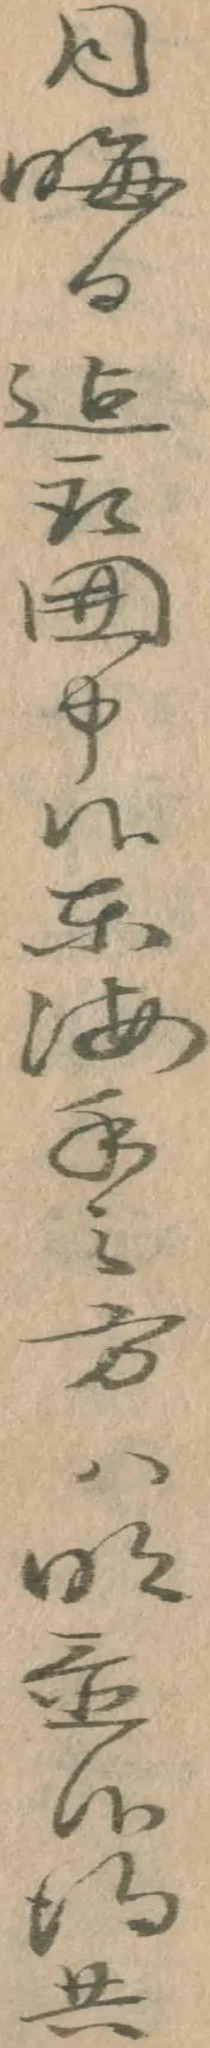月晦日迄取囲申候東海手之方は明置候得共
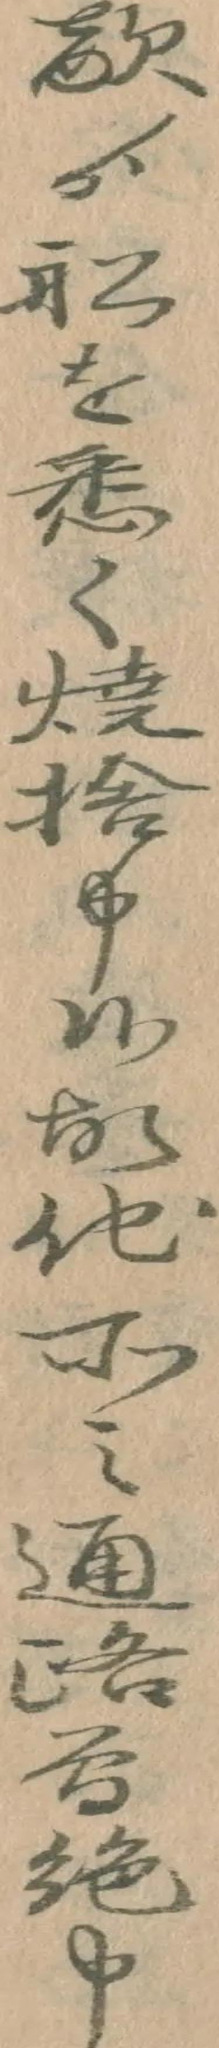敵ゟ舩を悉く焼捨申候故他所之通路曽絶申
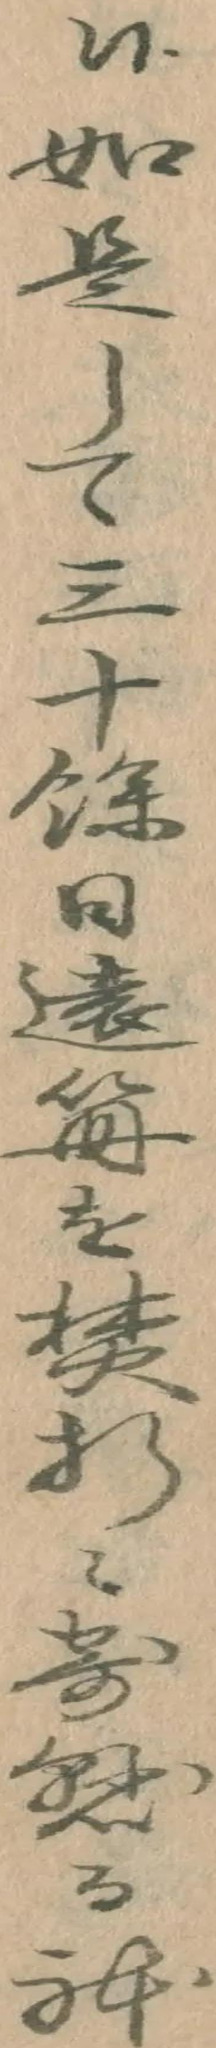候如是して三十余日遠筒を焚折之寄懸る躰
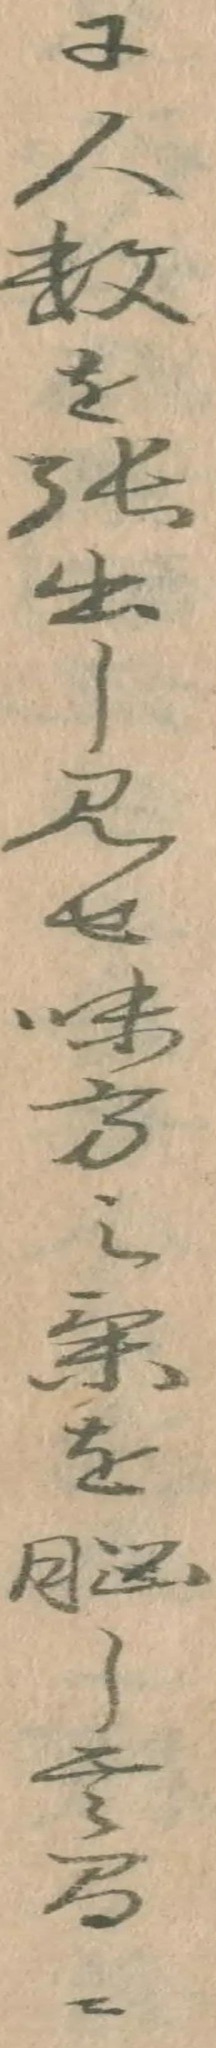尓人数を張出し見せ味方之気を脳し其間に
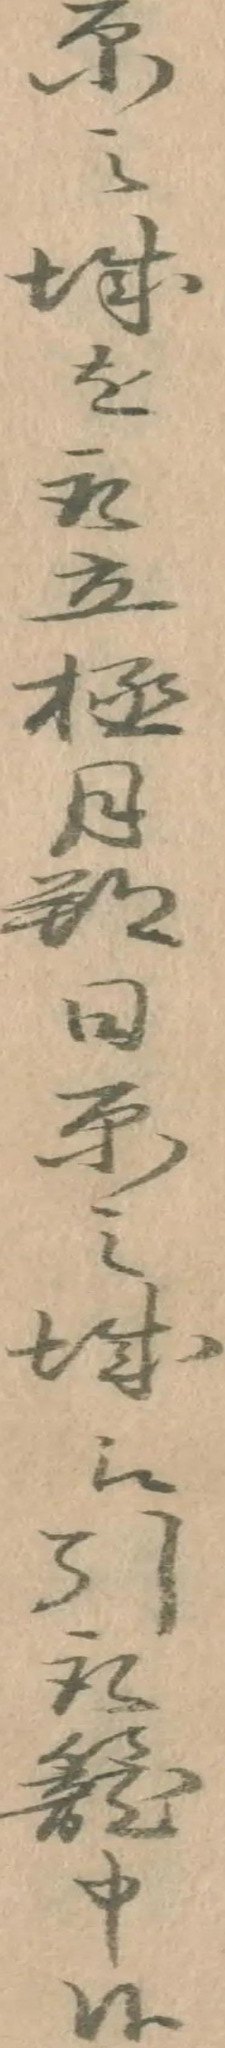原之城を取立極月朔日原之城江引取籠申候

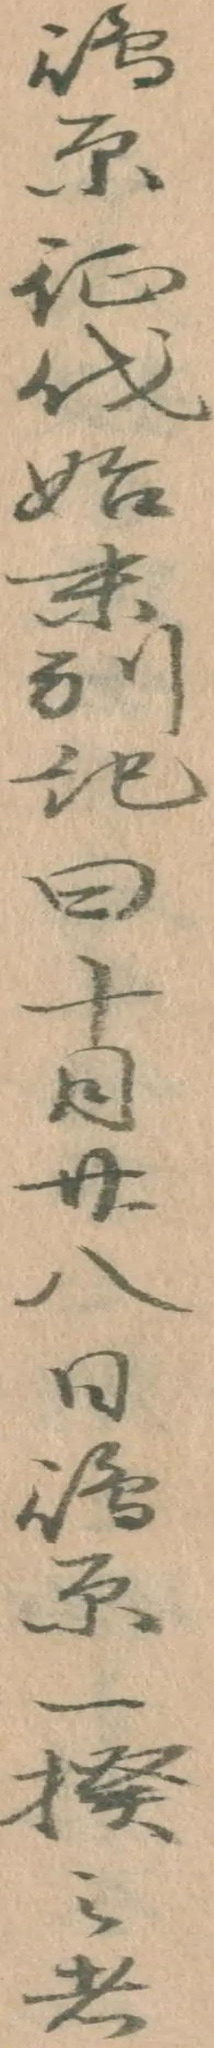島原征伐始末別記曰十月廿八日島原一揆之者
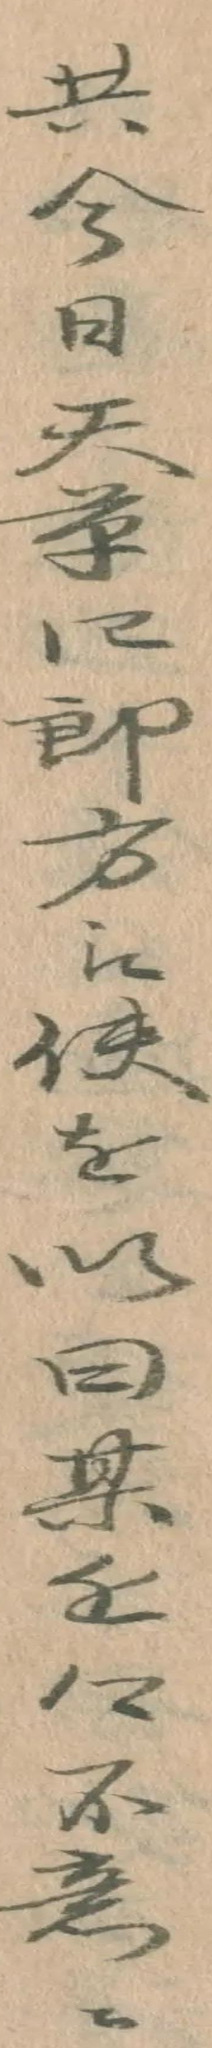共今日天草四郎方江使を以曰某近郷不意に
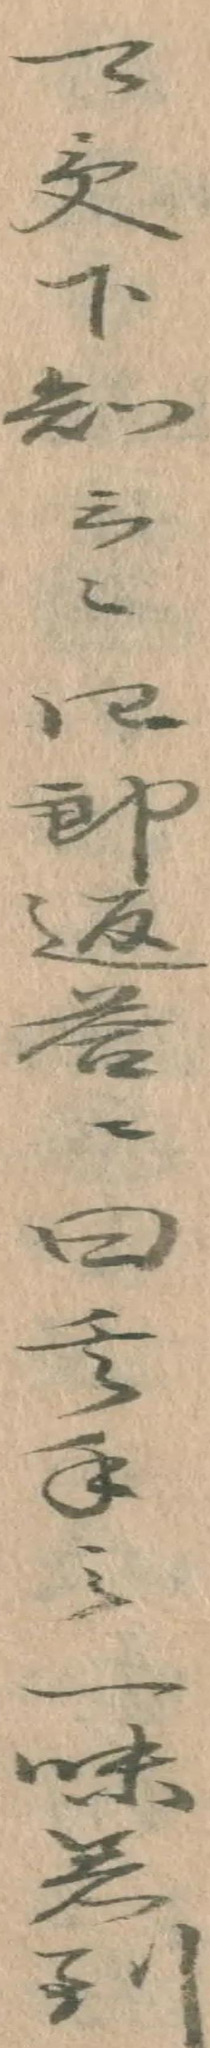可受下知云に四郎返答に曰其手之一味差別
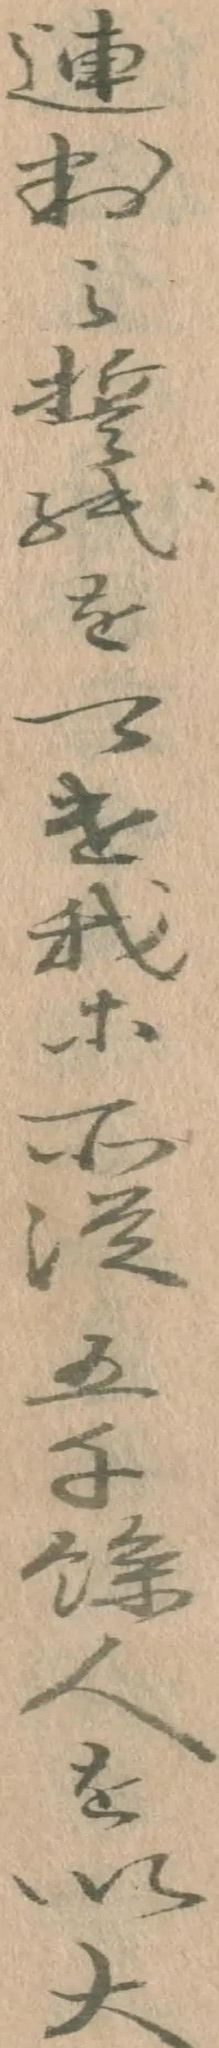連判之誓紙を可遣我等所従五千余人を以大
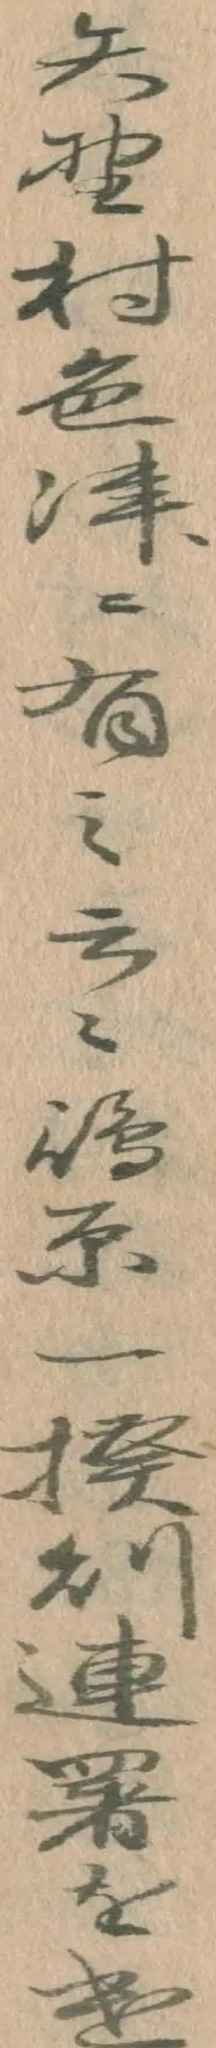矢野村色津に有之云々島原一揆則連署を遣
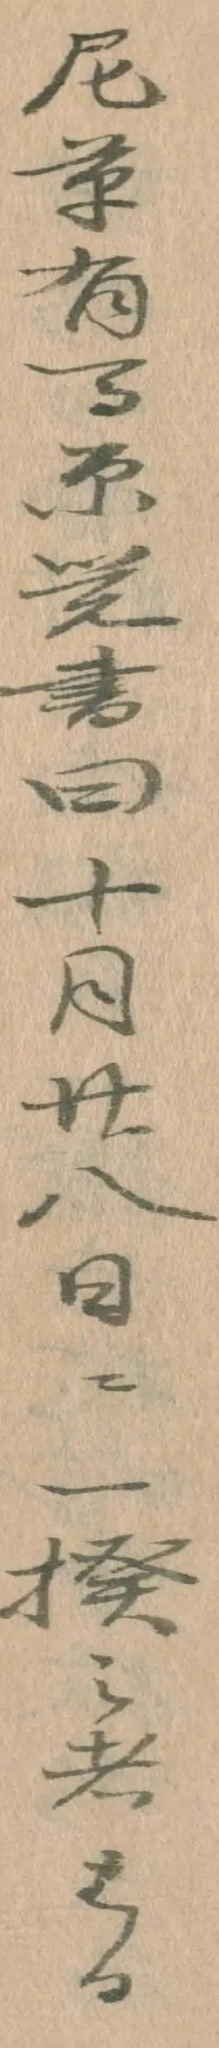尼草有馬原覚書曰十月廿八日に一揆之者はる
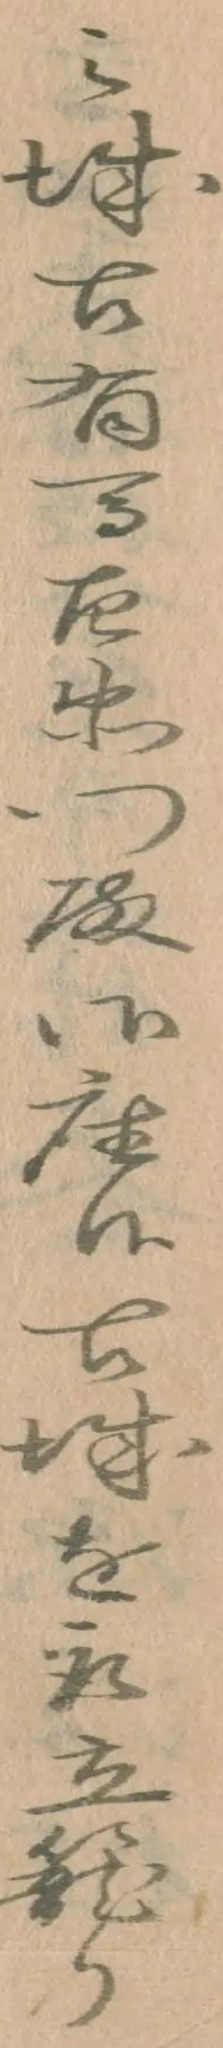之城古有馬左衛門殿御座候古城を取立籠り
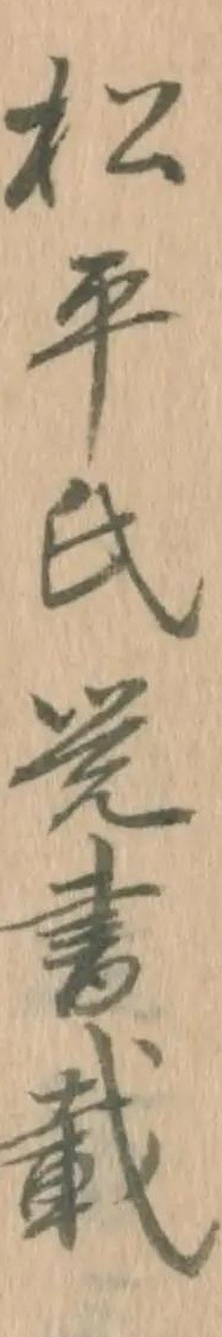松平氏覚書斎載
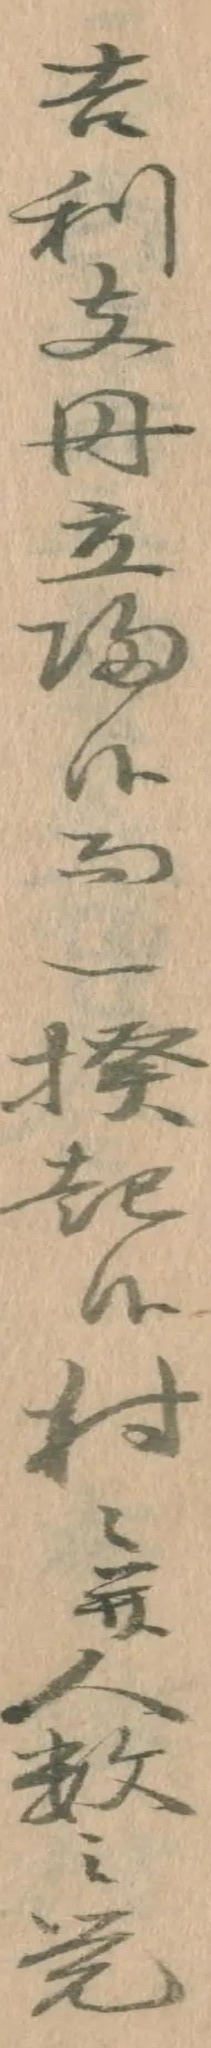吉利支丹立帰候而一揆起候村々幷人数之覚
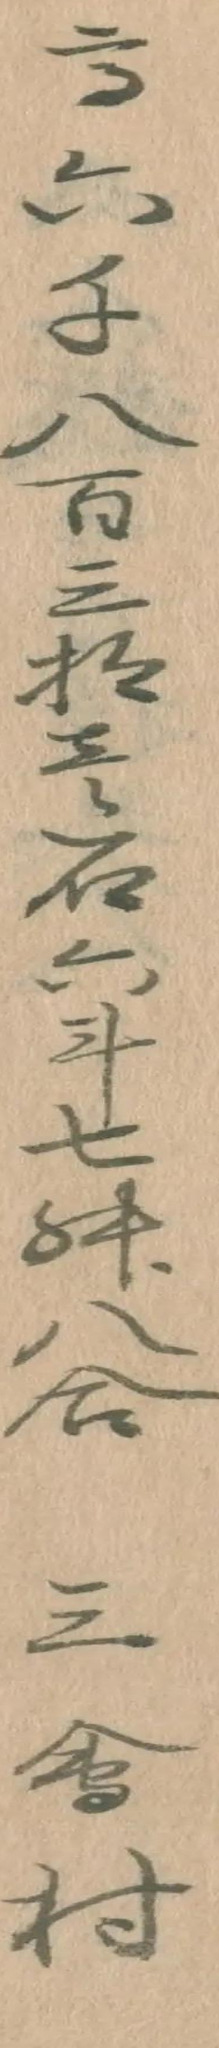高六千八百三拾壱石六斗七升八合三会村
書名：切支丹御退治記 49巻. [2]
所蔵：国立国会図書館 National Diet Library, JAPAN
